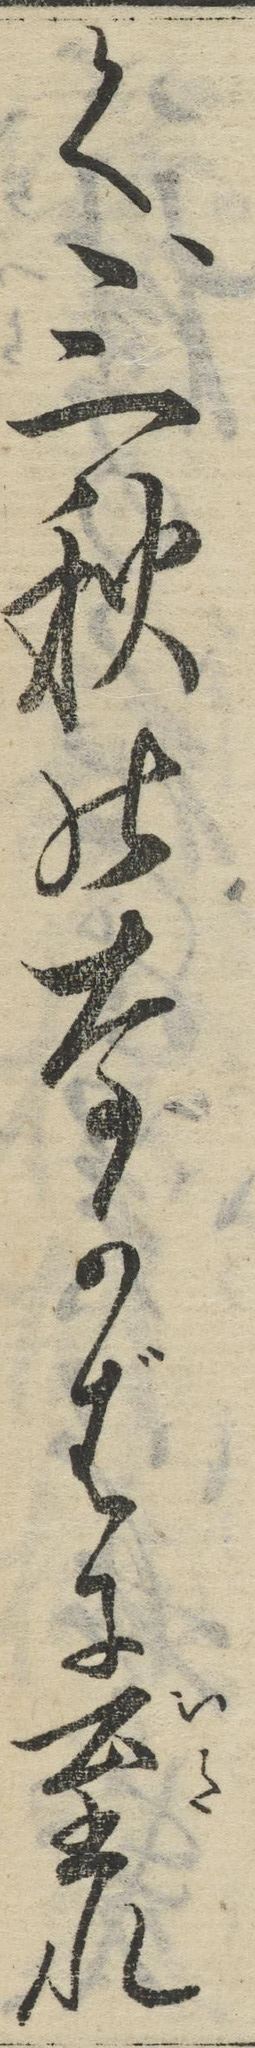く、三秋のなかばに至れ

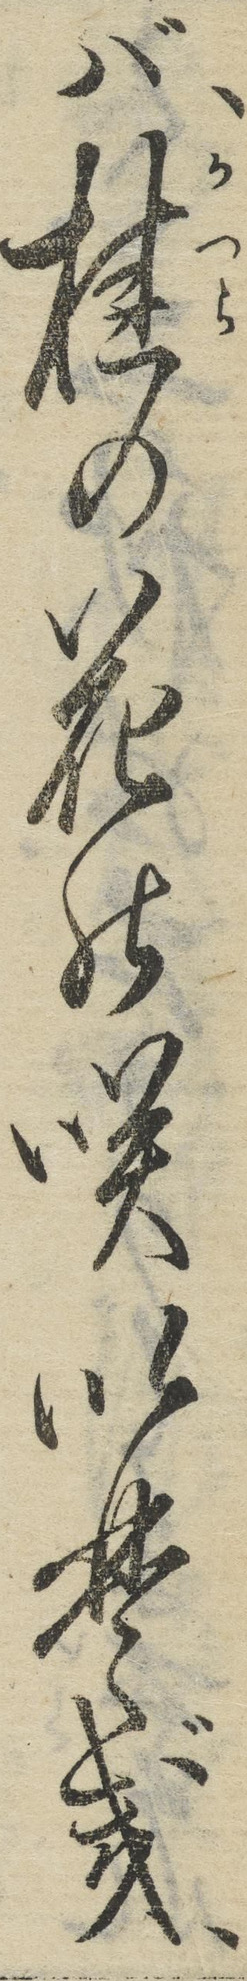ば、桂の花の咲いそぎ、
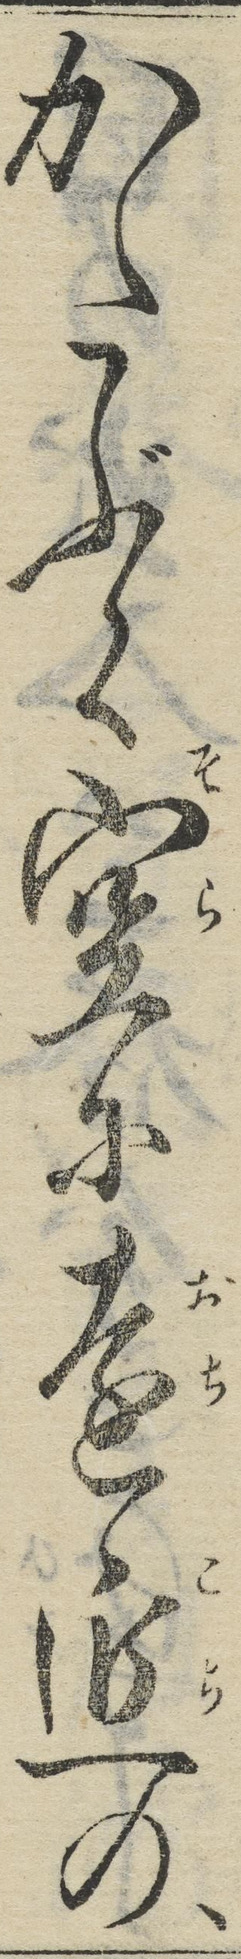かたぶく空に遠近の、
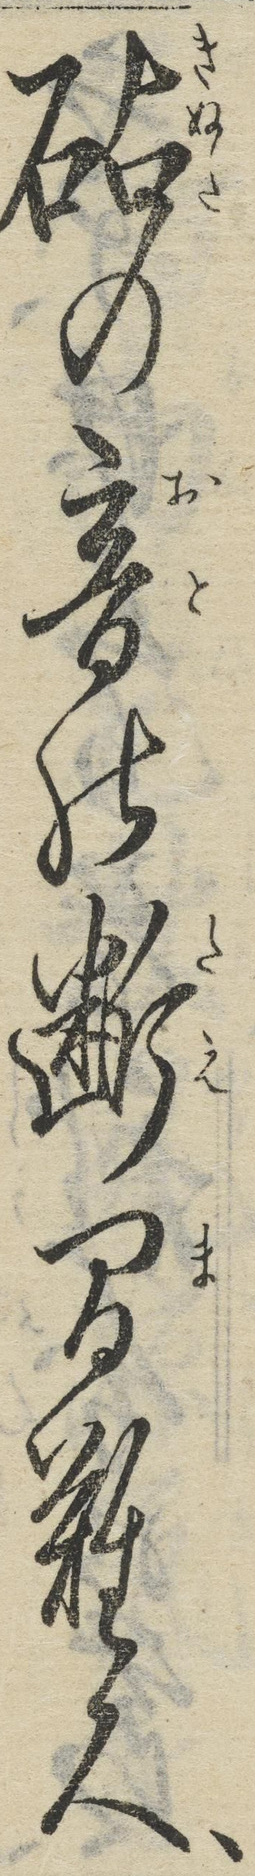砧の音の断間なく、
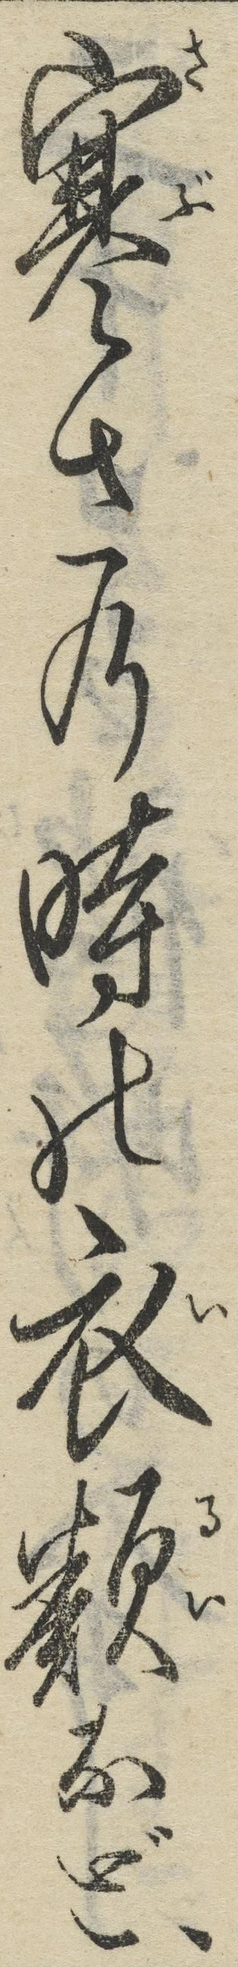寒さの時の衣類など、
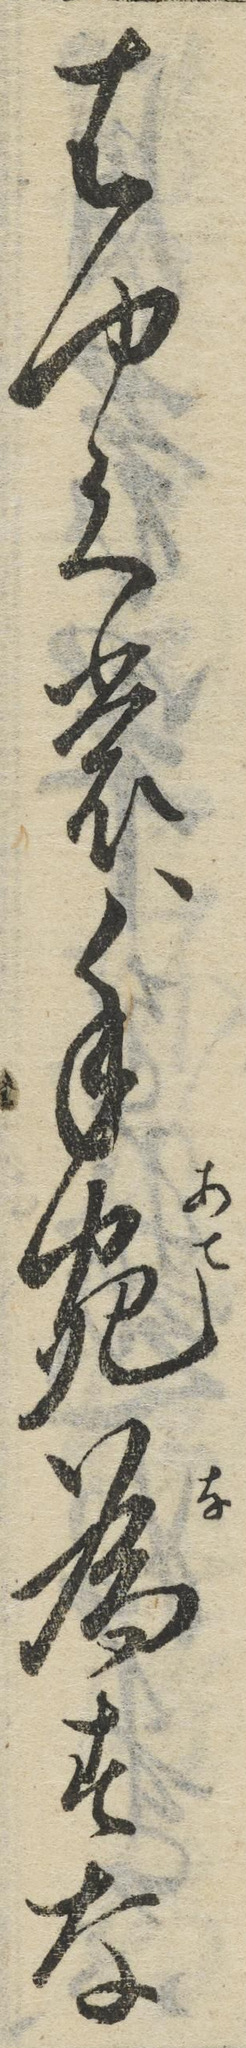はやくも、手宛為すな
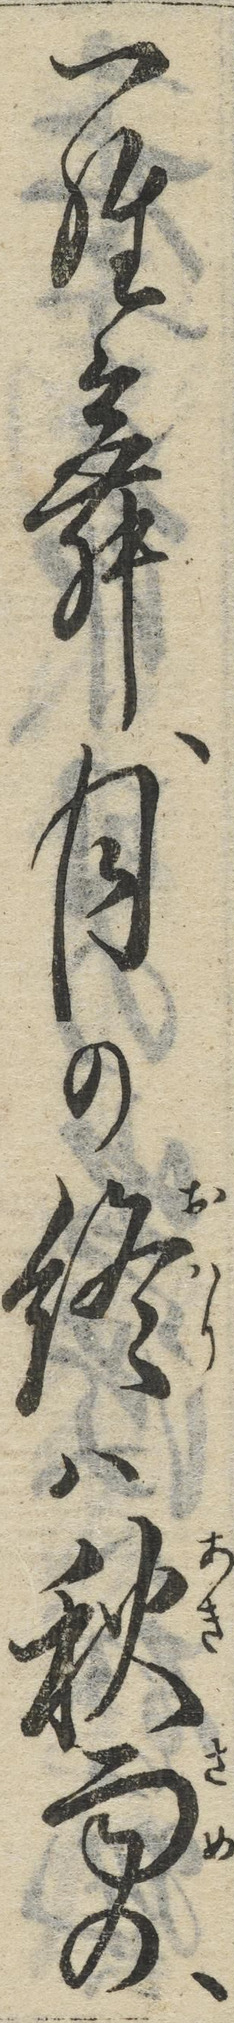らむ、月の終は秋雨の、
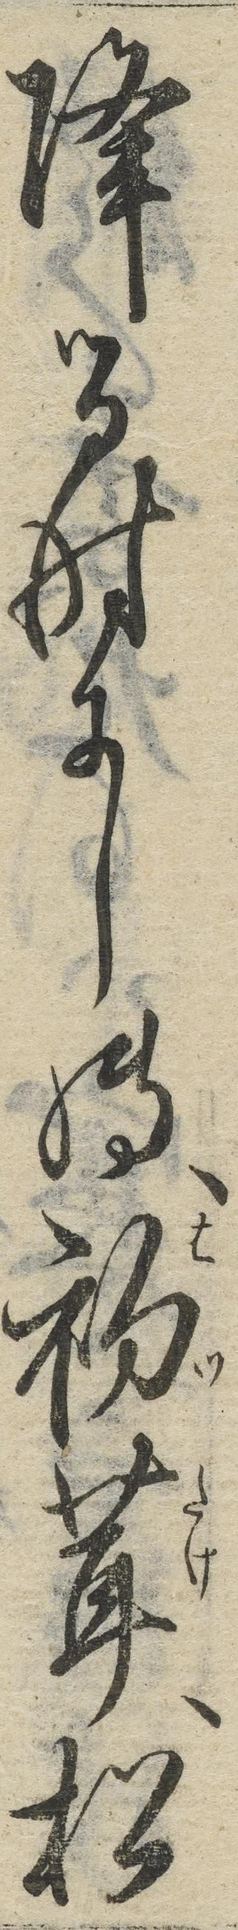降る時にして、初茸、松
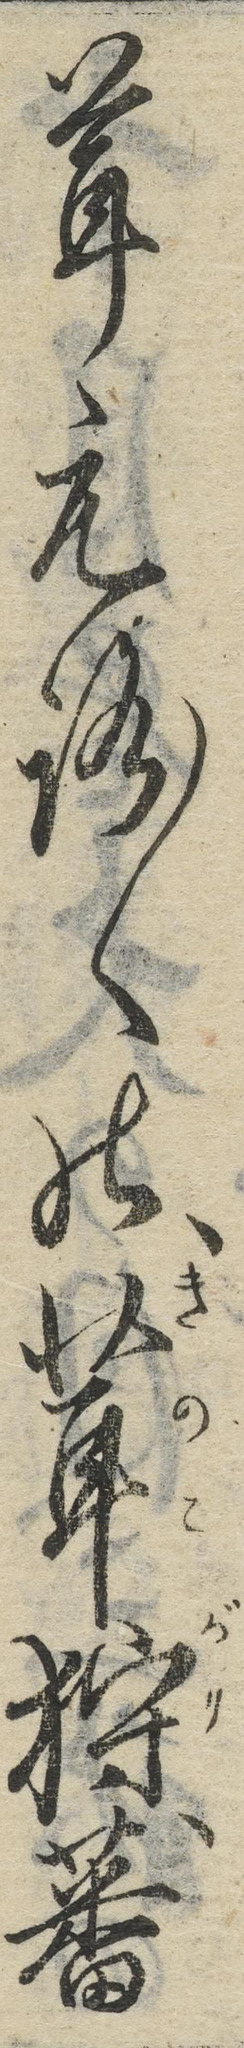茸もろ〳〵の、茸狩、蕃
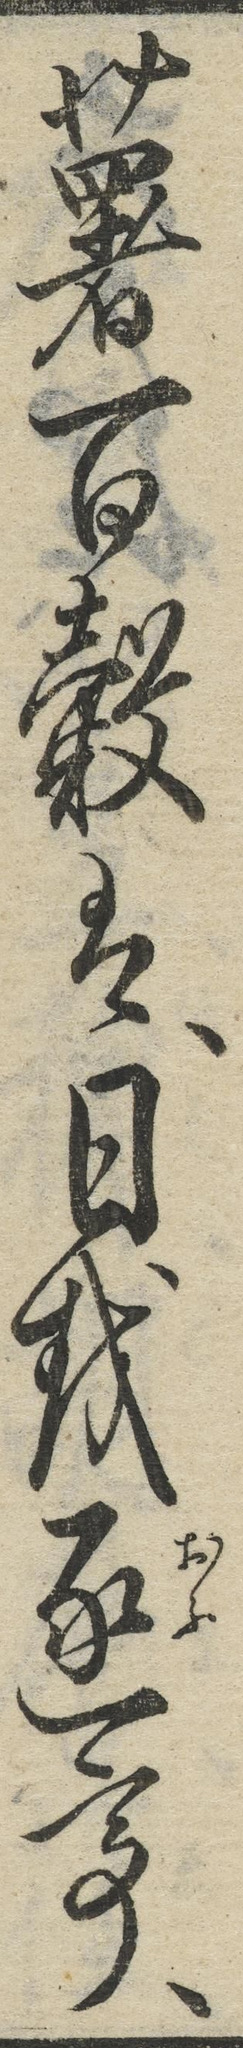薯百穀は、日を逐て、
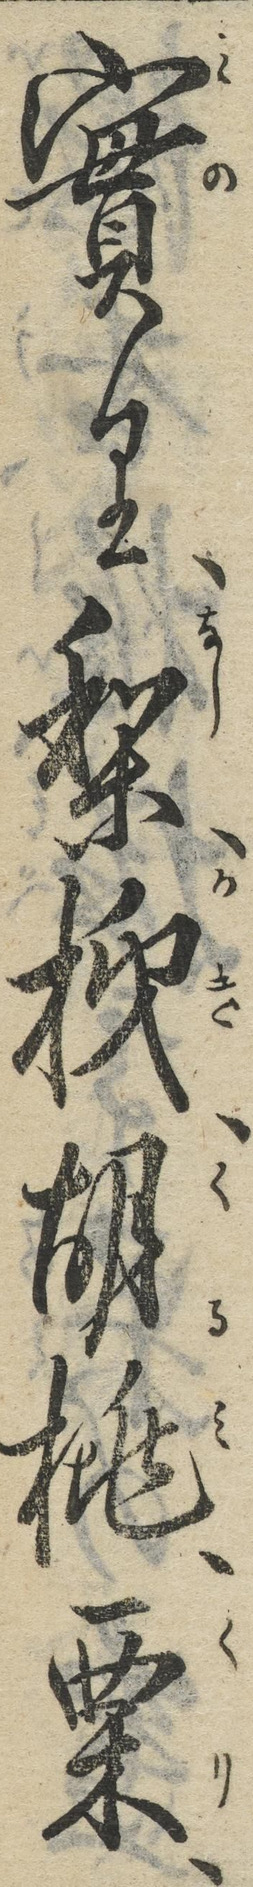実り、梨、柿、胡桃、栗、

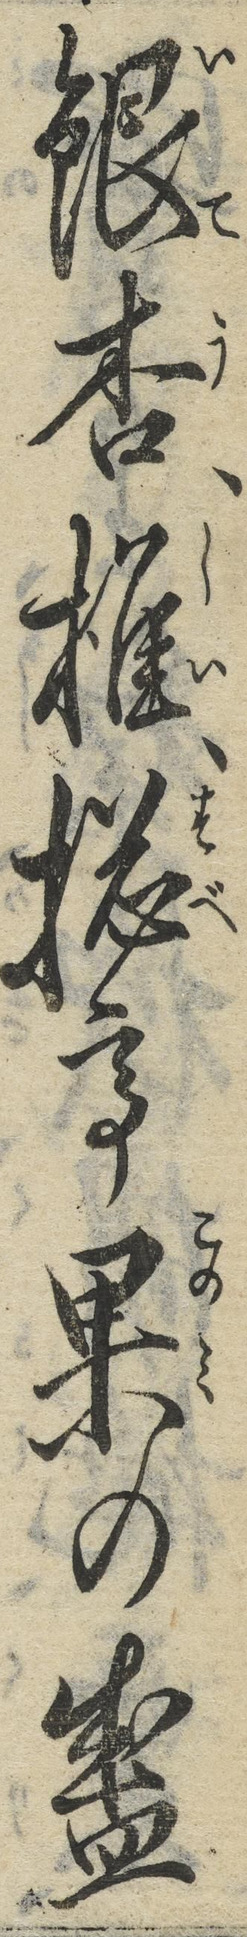銀杏、椎、摠て果の盛
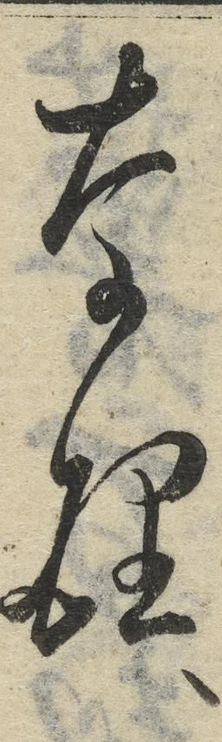なり、
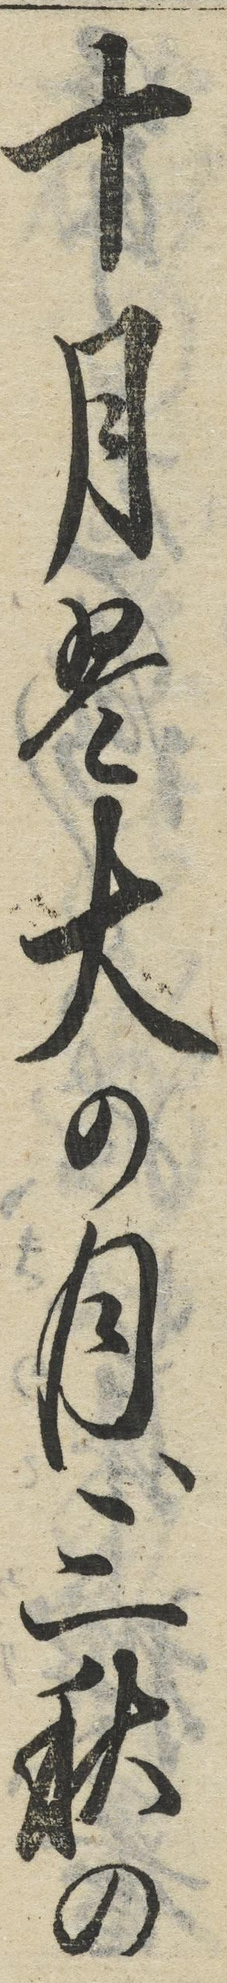十月は大の月、三秋の
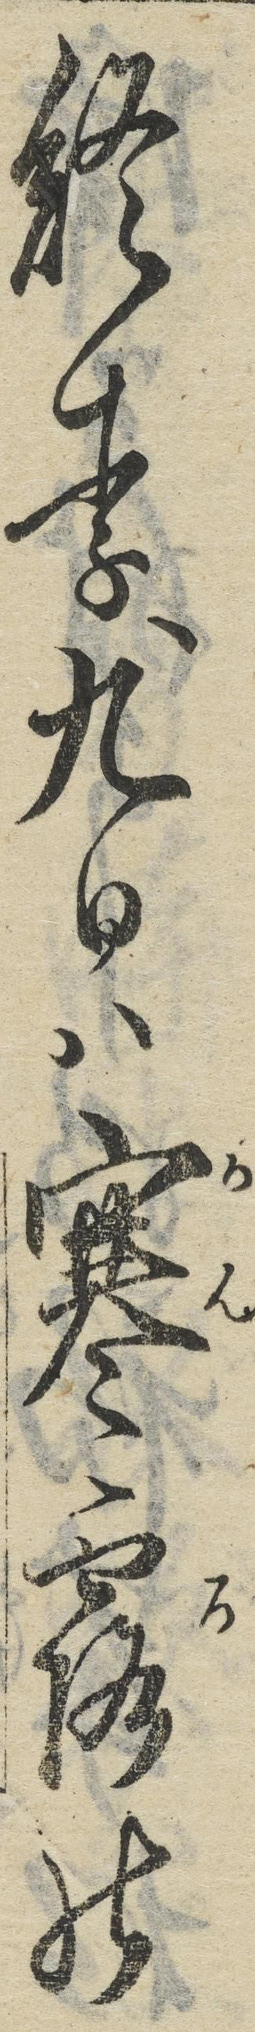終り、九日は寒露の
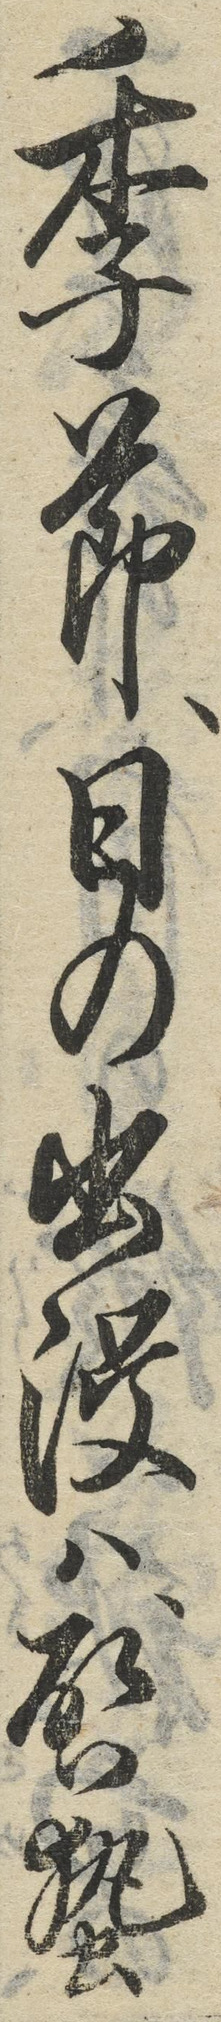気節、日の出没は、啓蟄
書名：暦日往来　單
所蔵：東京大学地震研究所図書室 Earthquake Research Institute Library, The University of Tokyo, JAPAN
